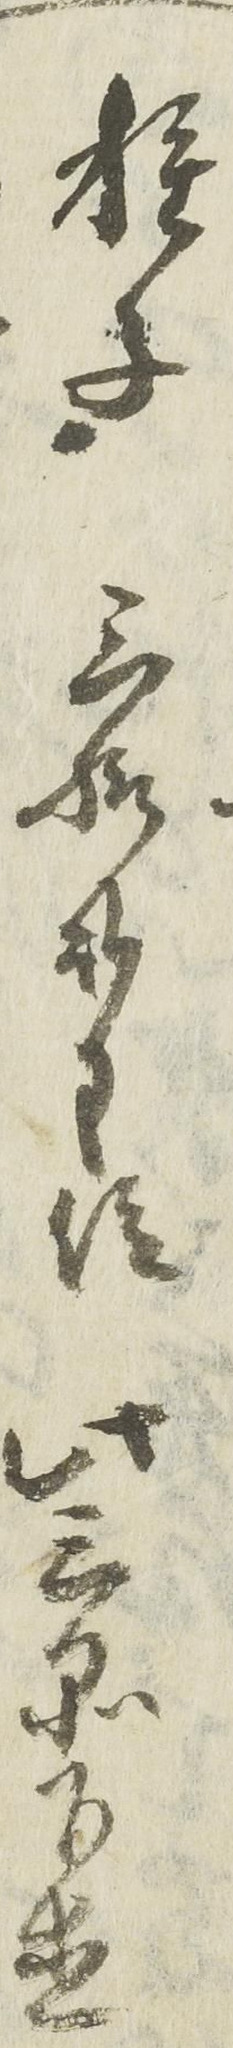大豆弐拾三匁位此三品下直
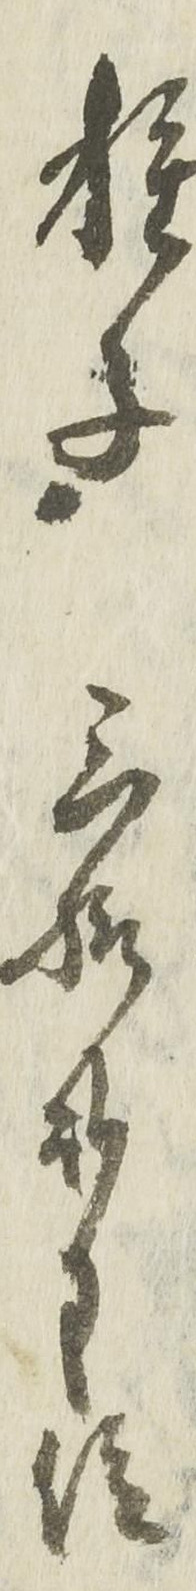種子三拾弐匁位
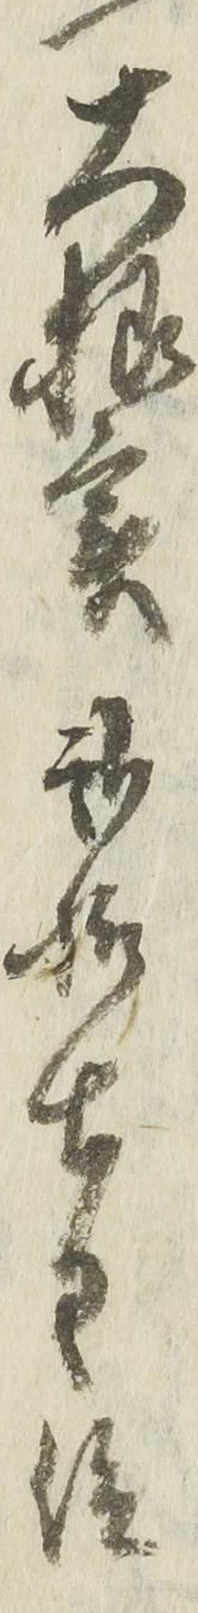大根実弐拾七匁位
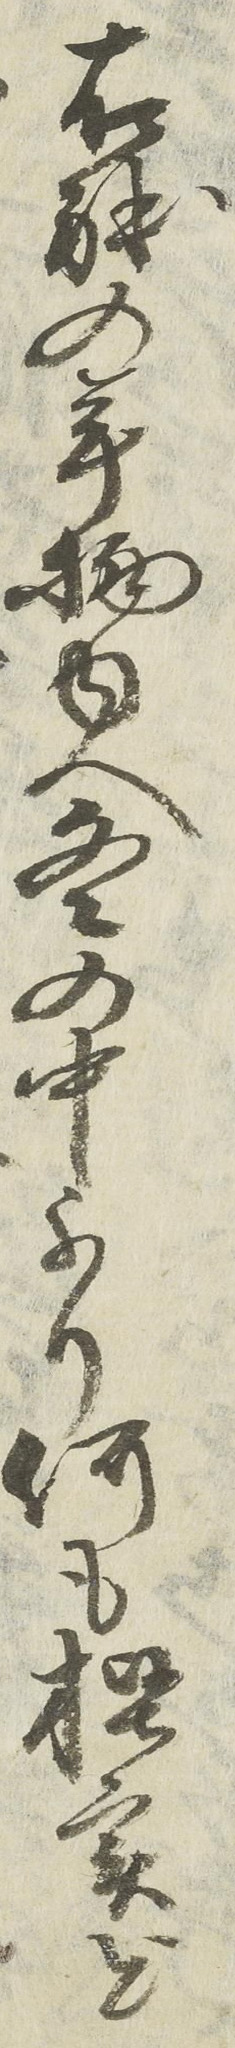右躰の年柄ゆへ冬の中より何も樫実を
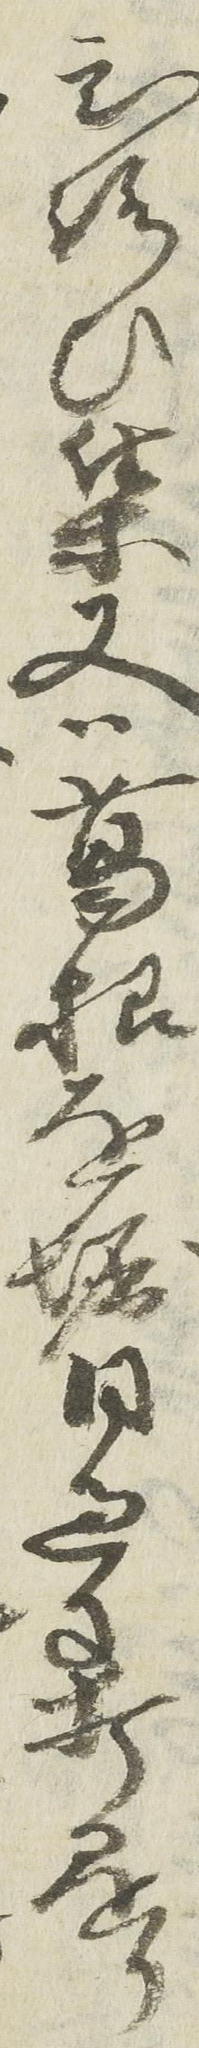ひろひ集又は葛根を堀日過に打懸り
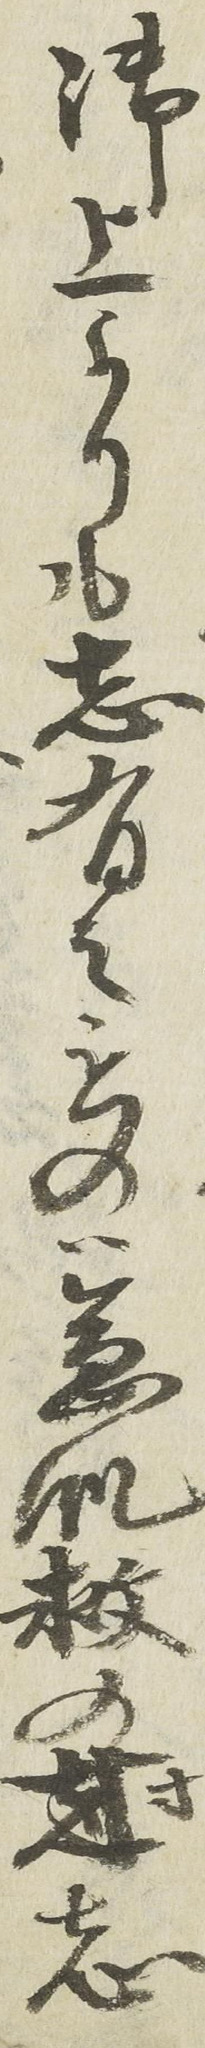御上よりも志有之ものは急飢救の寸志
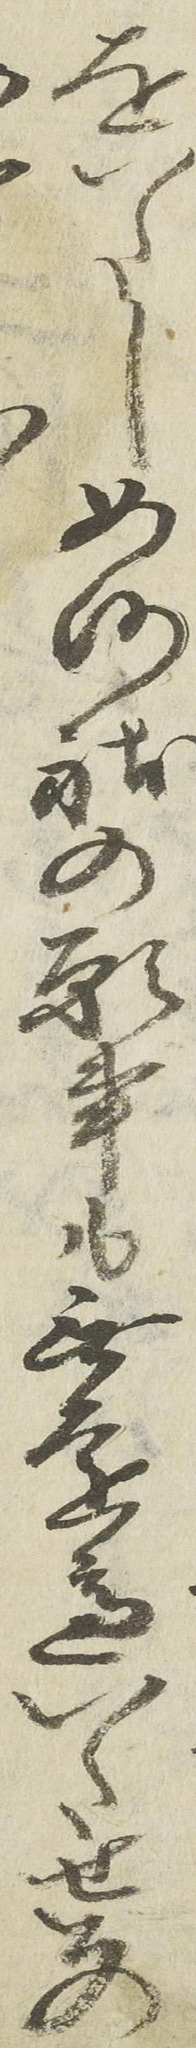をいたし如何躰の願事も無遠慮いたせ為
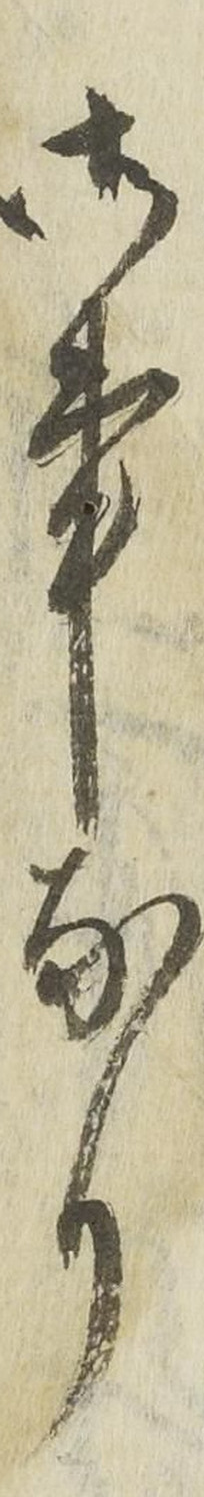御事なり

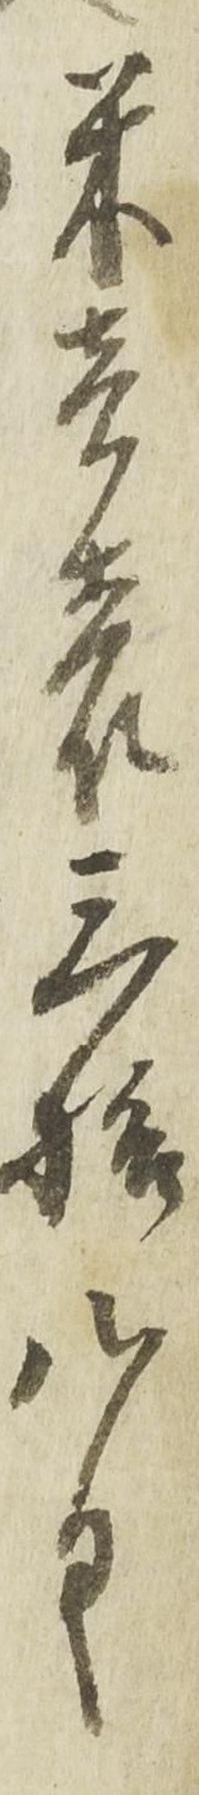粟壱表弐拾八匁
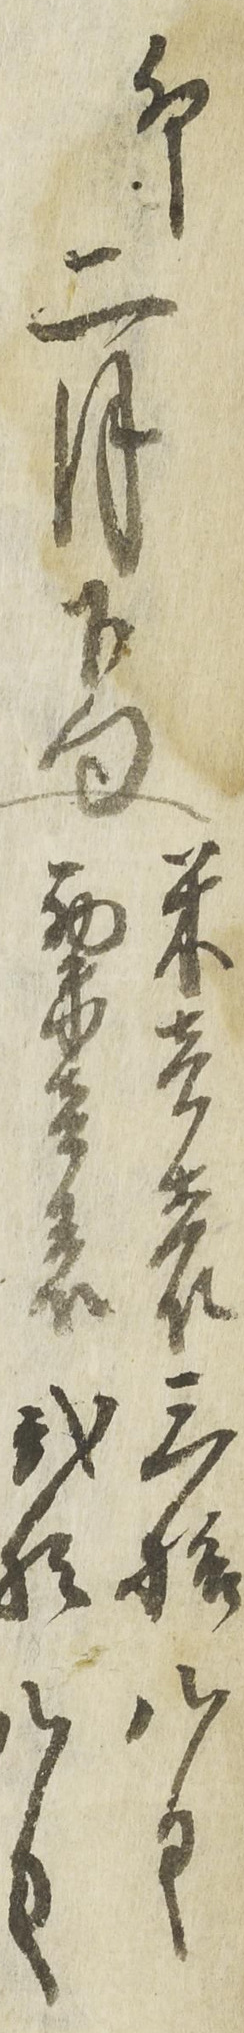卯二月下旬米壱表三拾八匁
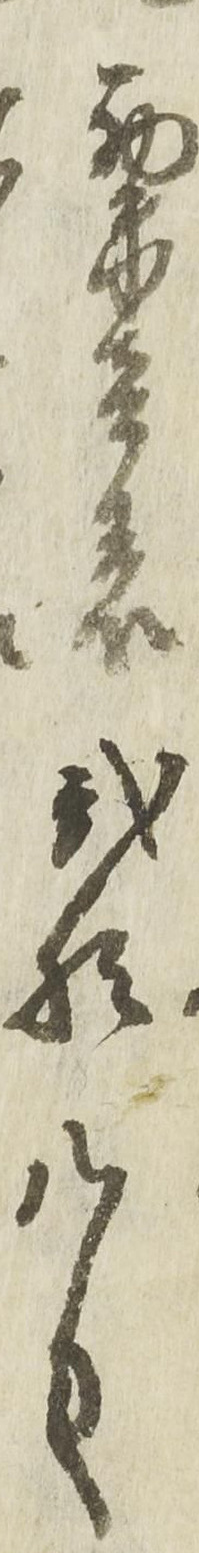粟壱表弐拾八匁
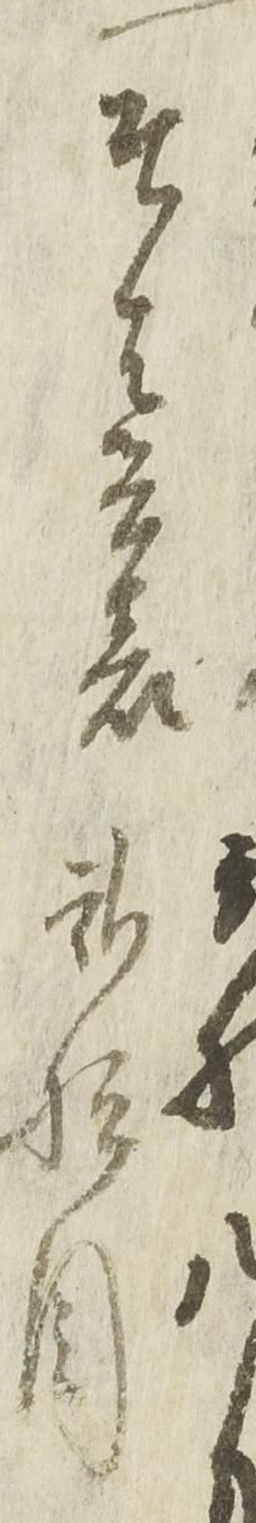そは壱表弐拾目
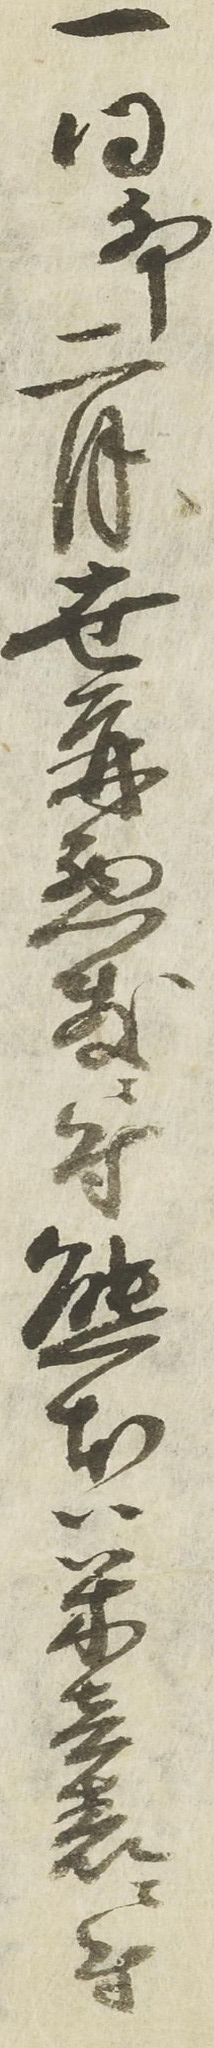一同卯二月世并悪敷ニ付熊本は米壱表ニ付
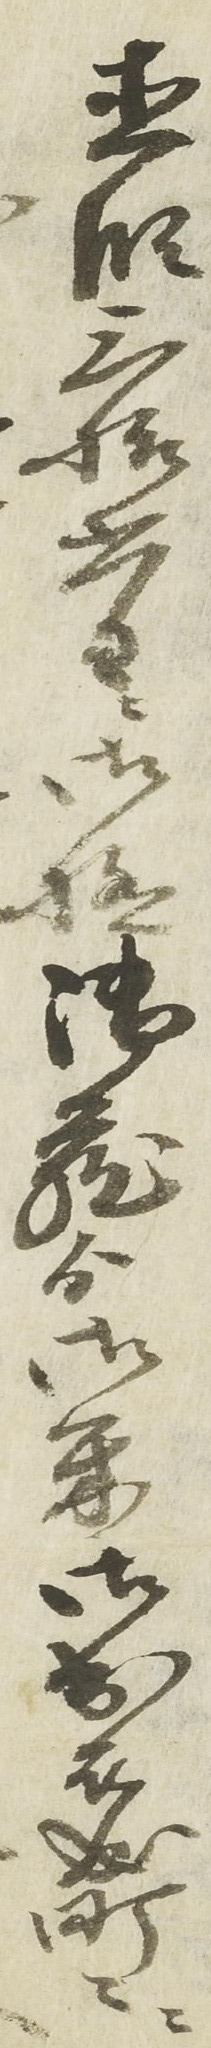直段三拾六匁ニ御極御蔵ゟ御米御出被成町々二
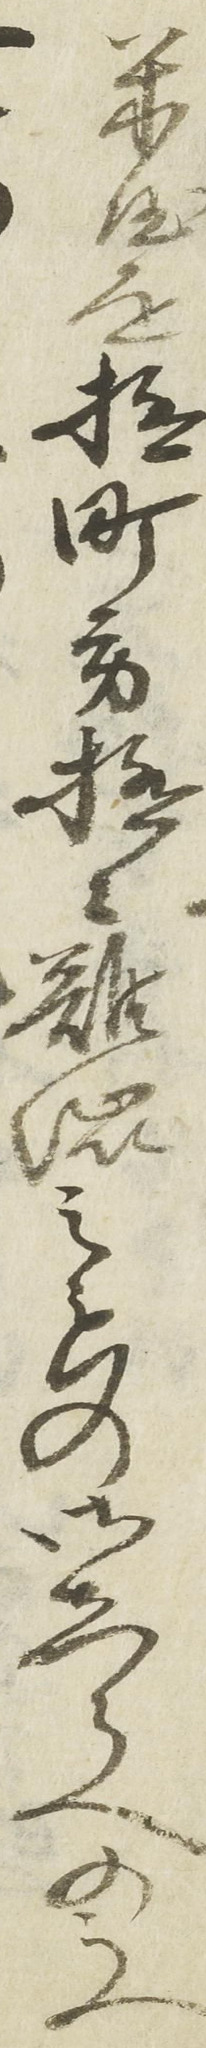米屋を拾町方極二難渋之もの御壱人のうえ
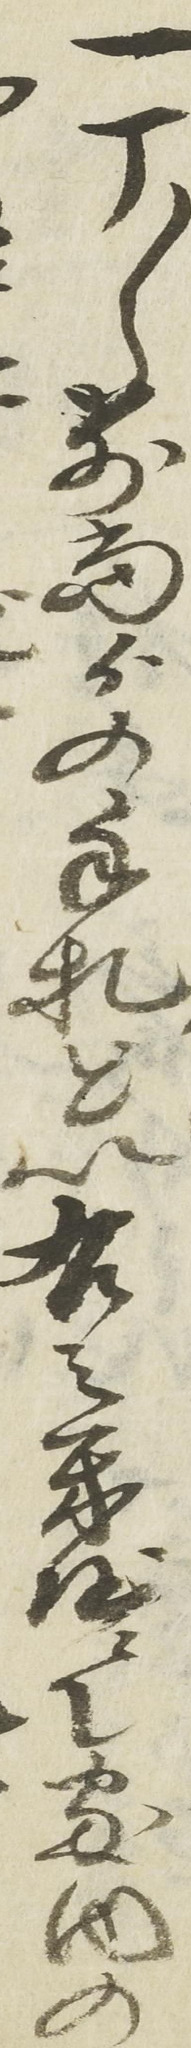一丁〳〵別当ゟの手札を以有之米屋ニて家内の
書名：後見笑
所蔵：東京大学地震研究所図書室 Earthquake Research Institute Library, The University of Tokyo, JAPAN
